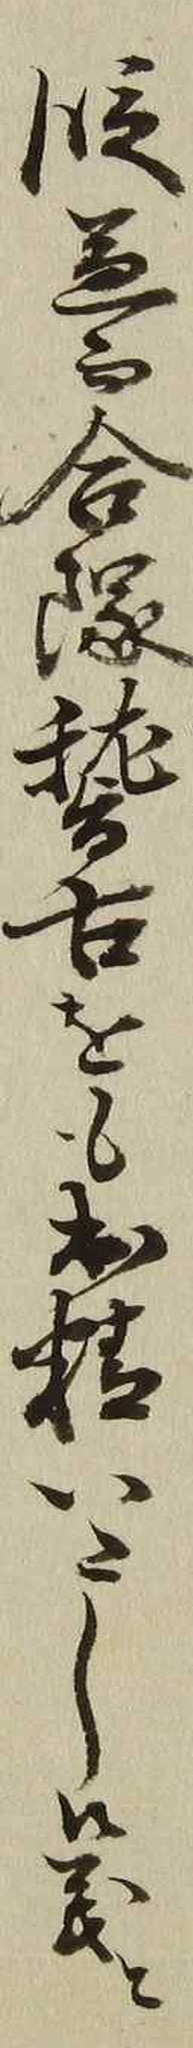段兼而合隊稽古をも出精いたし候義と
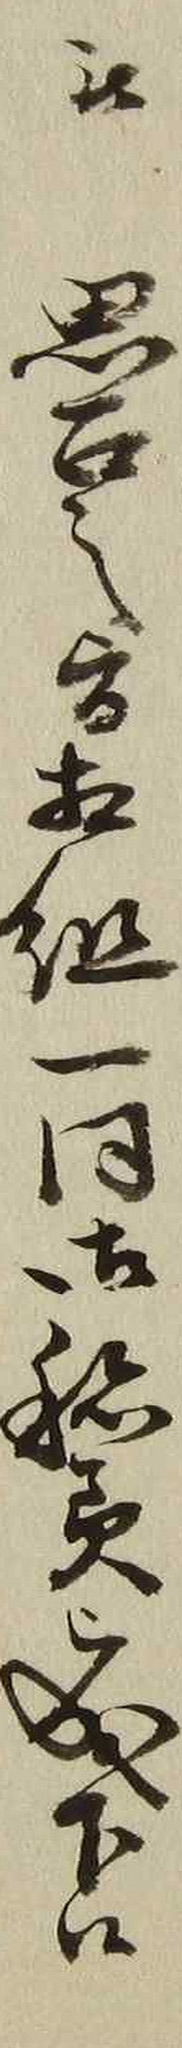被思召之旨相組一同御称美被成下候
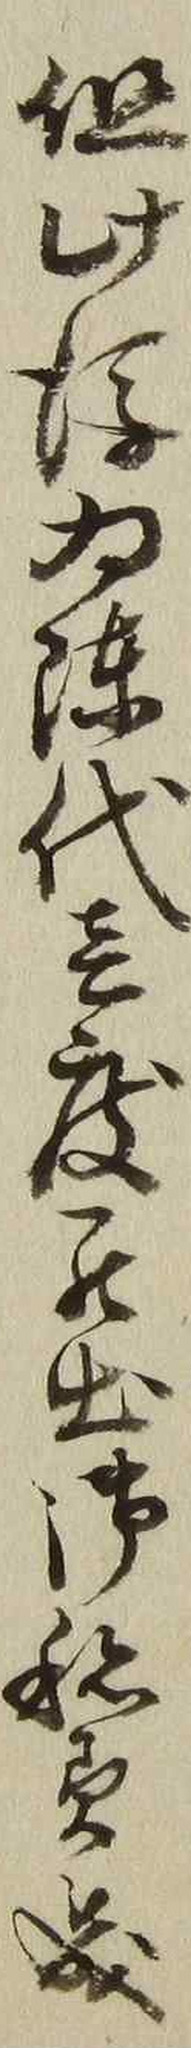但此後為陣代壱度罷出御称美被成
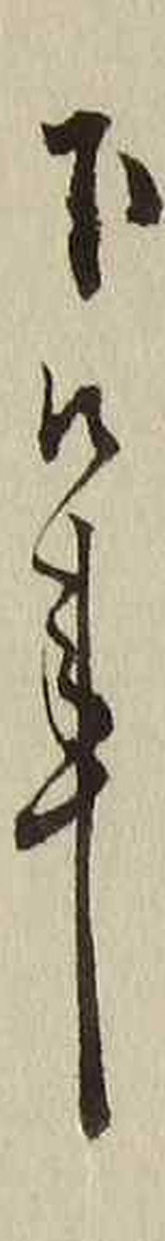下候事
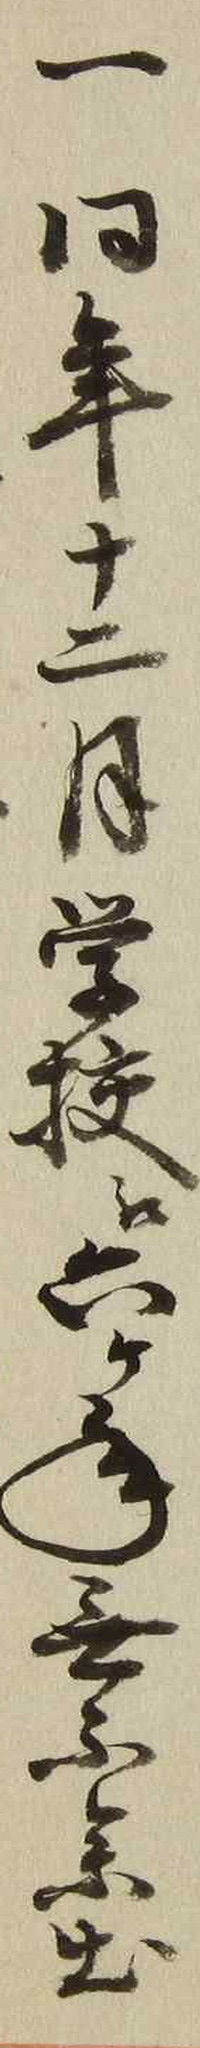一同年十二月学校江六ケ年無不産出
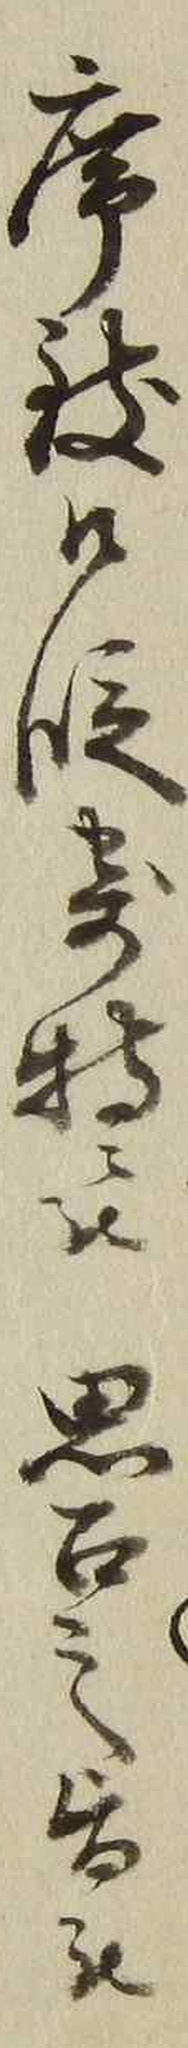席致候段奇特ニ被思召之旨被
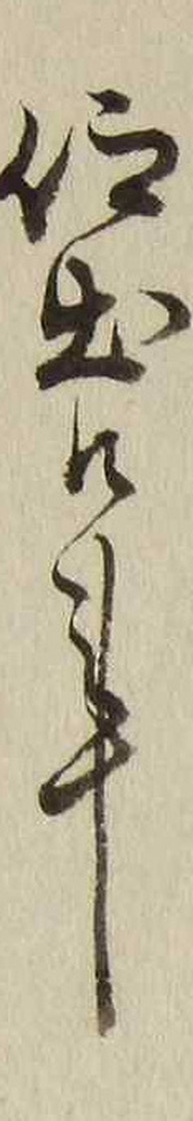仰出候事
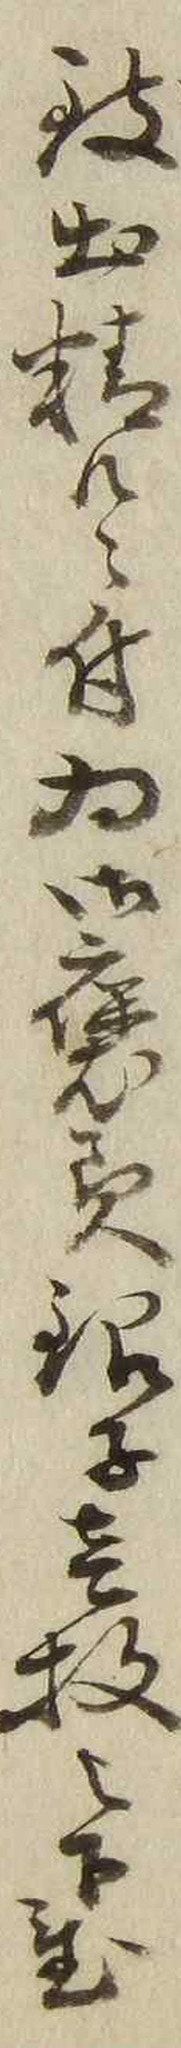致出精候ニ付為御褒美銀子壱枚被下置

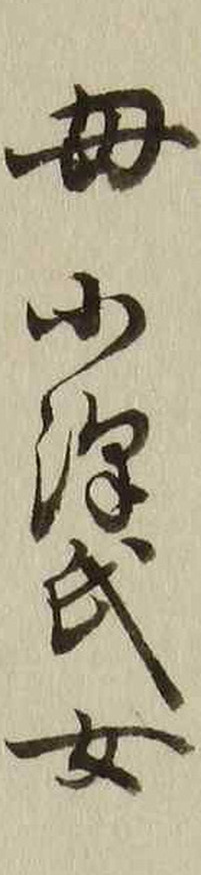母小沢氏女

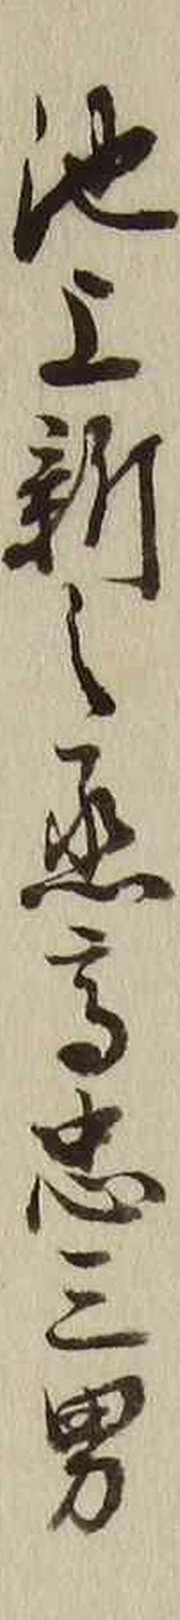池上新之丞高忠三男
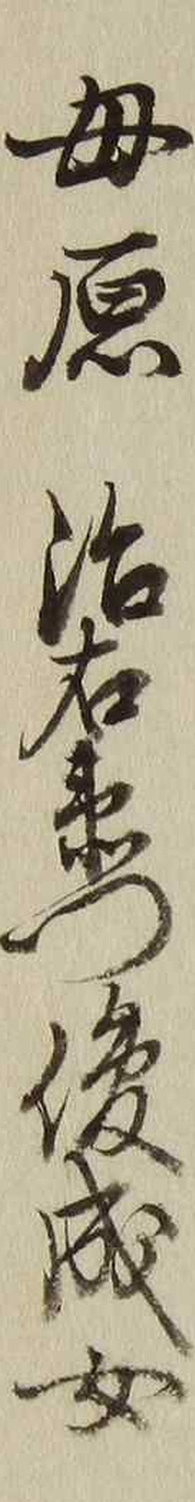母原治右衛門俊成女
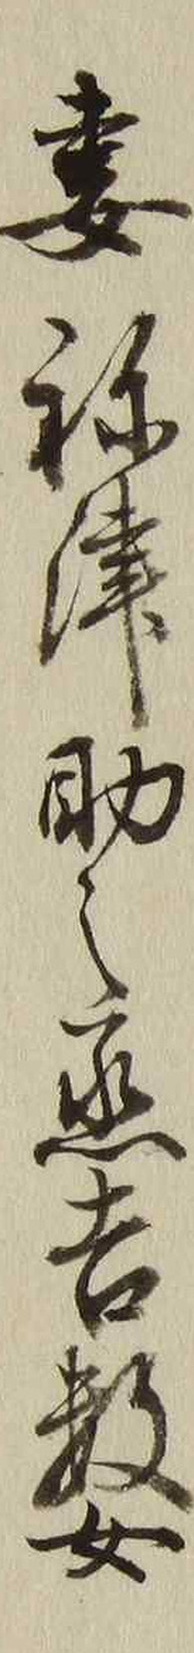妻祢津助之丞吉数女

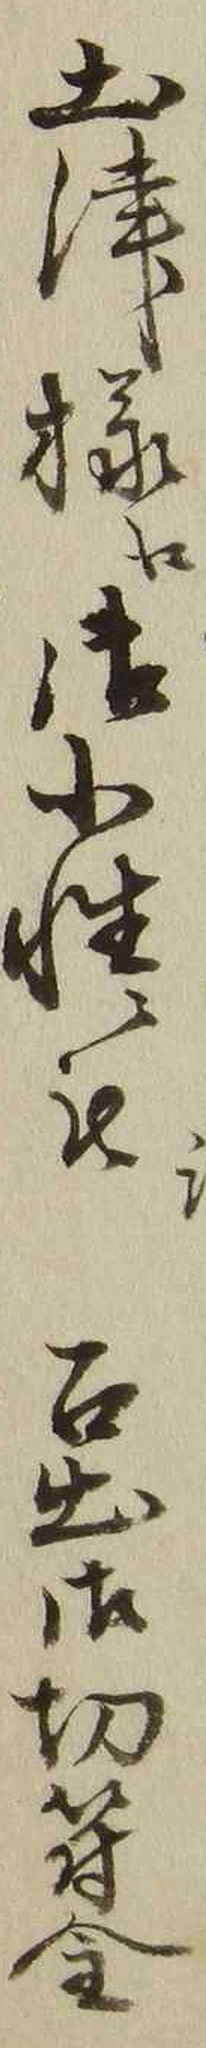土津様江御小性ニ被召出御切符金
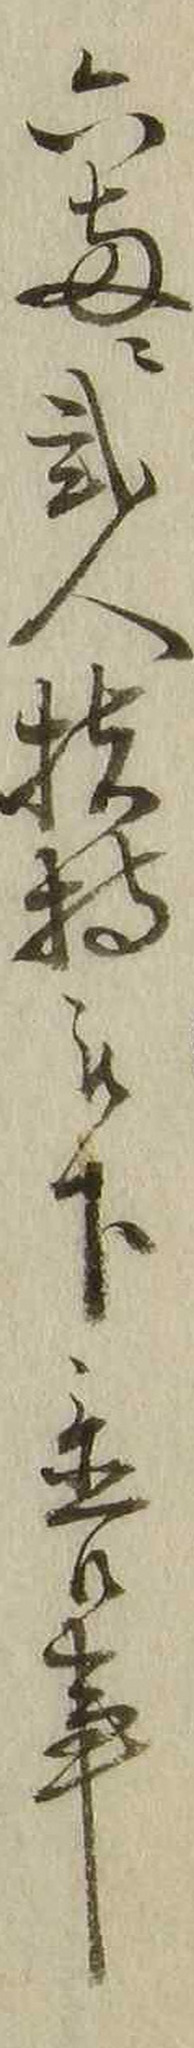六両ニ弐人扶持被下置候事
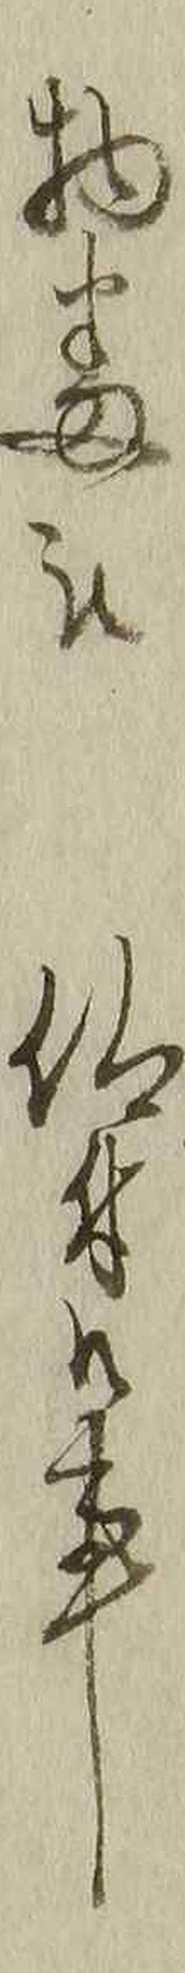物番被仰付候事
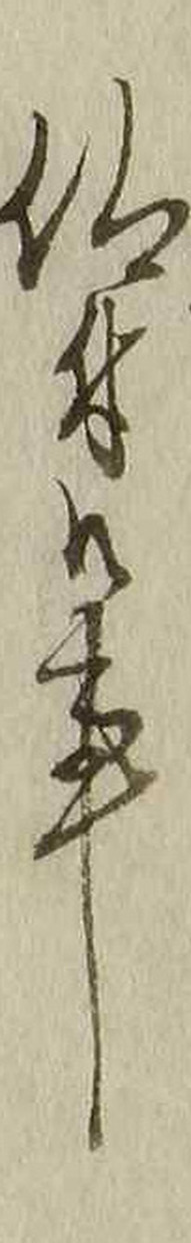仰付候事
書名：諸士系譜　巻之31　い之部31
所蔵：会津若松市立会津図書館
